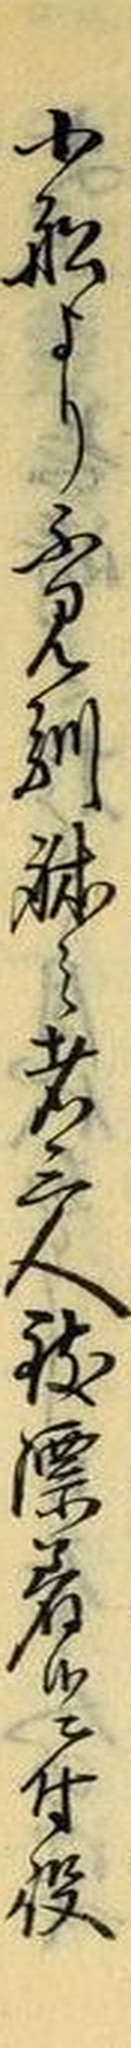小船より不見馴体之者三人致漂着候に付役
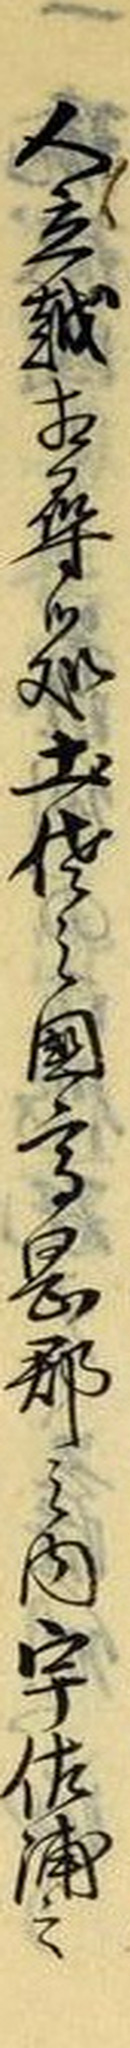人立越相尋候処土佐之国高岡郡之内宇佐浦之
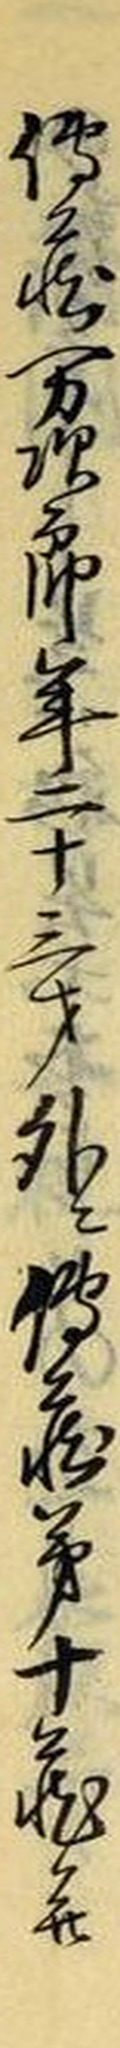傳蔵万次郎年二十三才外に傳蔵弟十蔵幷
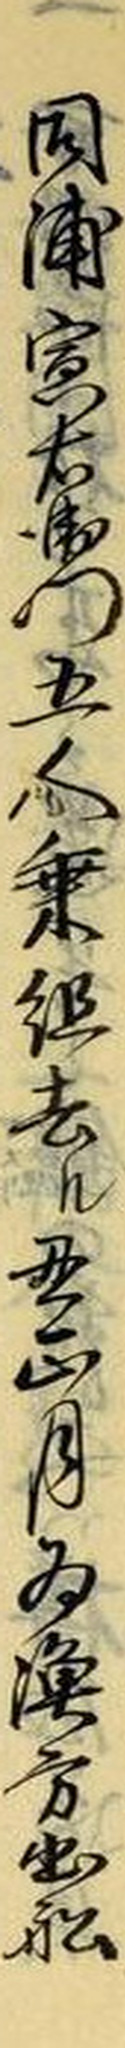同浦寅右衛門五人乗組去る丑正月為漁方出船
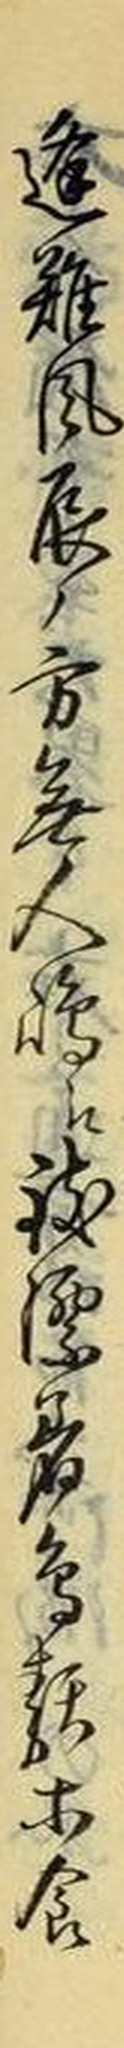逢難風辰ノ方無人島え致漂着鳥類等食
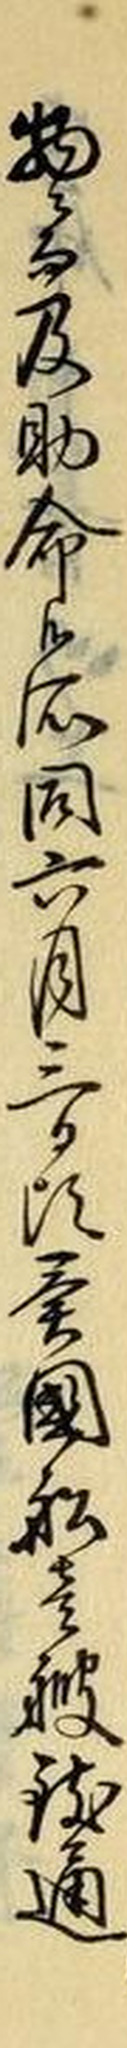物に而及助命候所同六月三日頃異国船壱艘致通
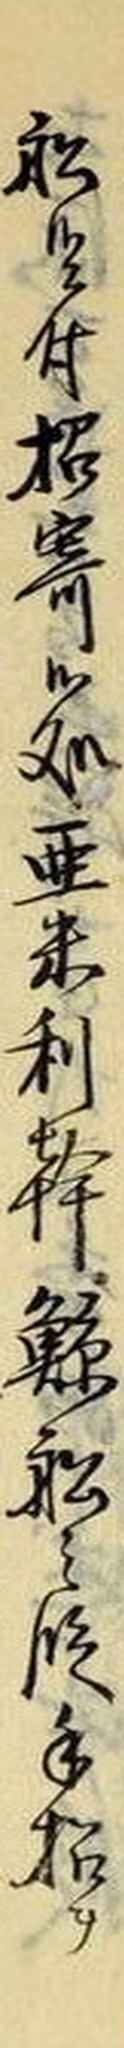船候に付招寄候処亜米利幹鯨船之段手招を
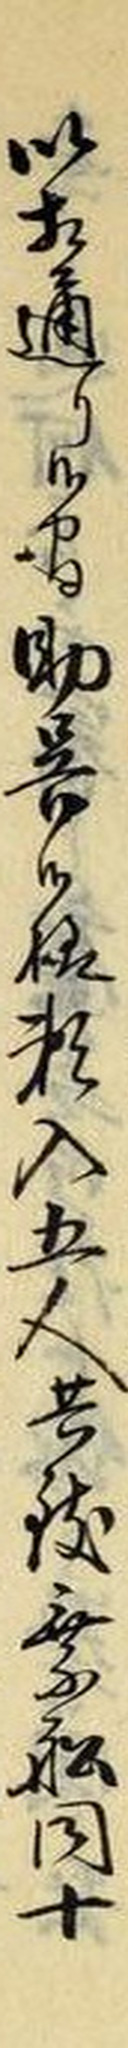以相通り候間助呉候様頼入五人共致乗船同十
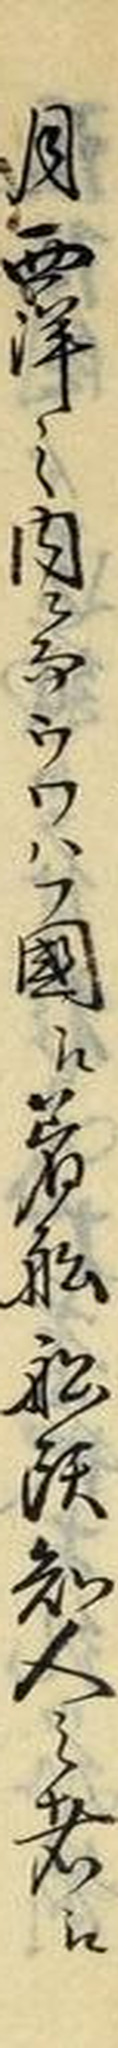月西洋之内に而ウワハフ国え着船船頭知人之者え
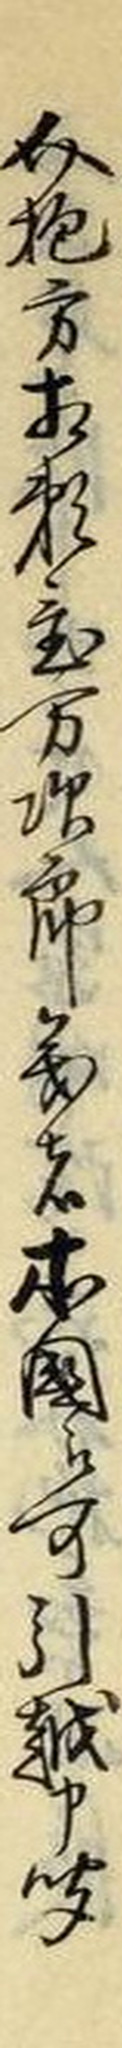介抱方相頼置万次郎義者本国え可引越申聞
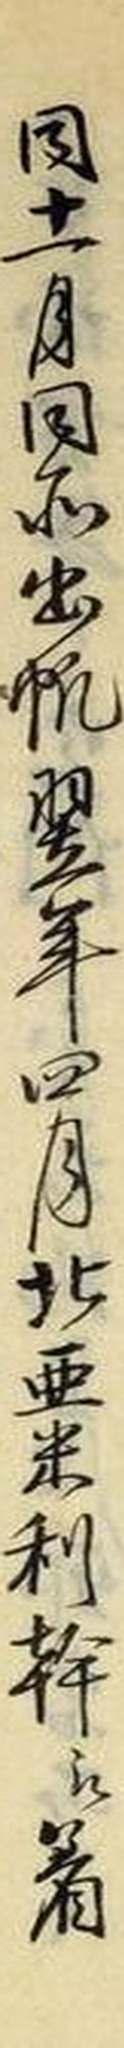同十一月同所出帆翌年四月北亜米利幹え着
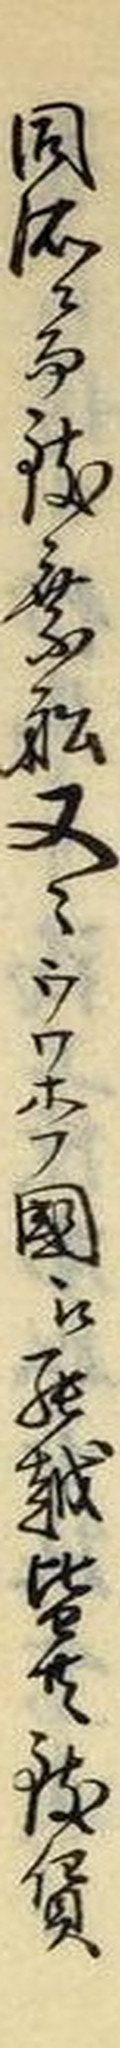同所に而致乗船又々ウワホフ国え罷越皆共致賃
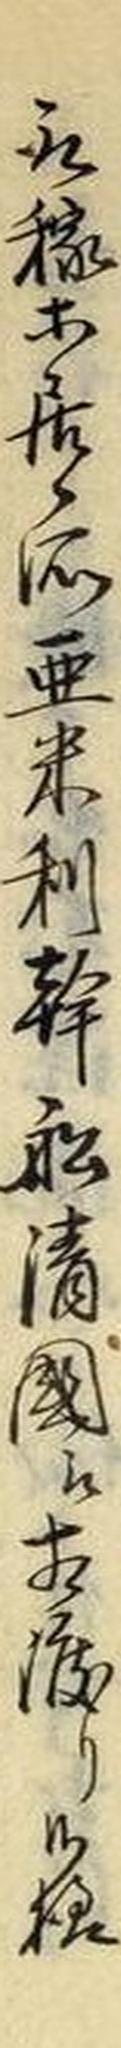取稼等居候所亜米利幹船清国え相渡り候様
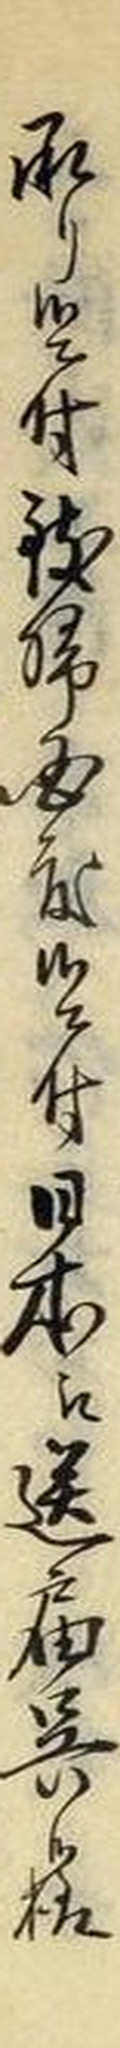承り候に付致帰国度候に付日本え送届呉候様
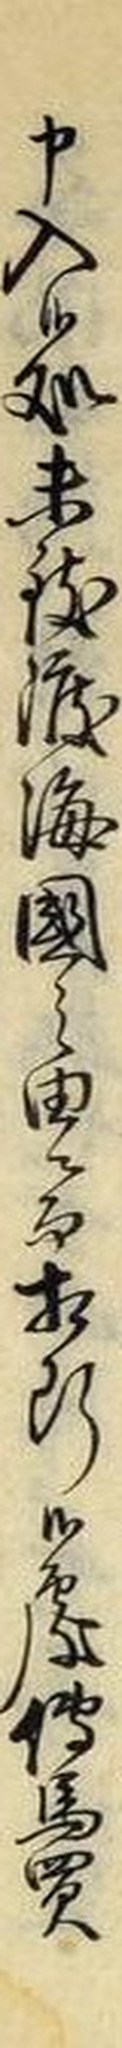申入候処未致渡海図之由に而相断候處伝馬買
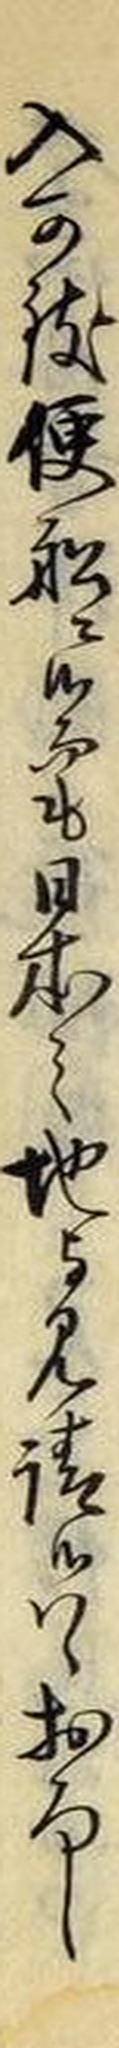入可致便船に候而も日本之地と見請候ハヽおろし
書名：漂客談奇（備考雑録写8）
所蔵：福井県文書館 Fukui Prefectural Archives
